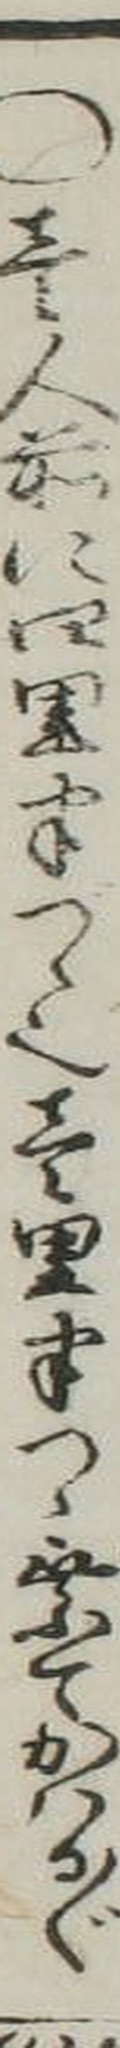○壱人前に四里半づゝ也壱里半づゝ乗てかはる〴〵
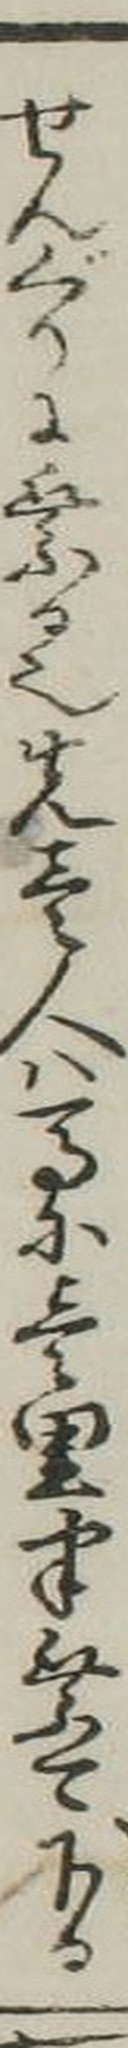せんぐりに乗る也先壱人は馬に壱里半乗て下る
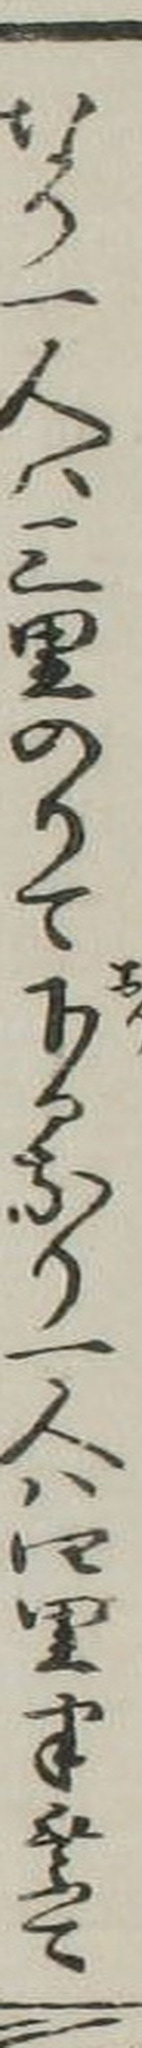なり一人は三里のりて下るなり一人は四里半乗て
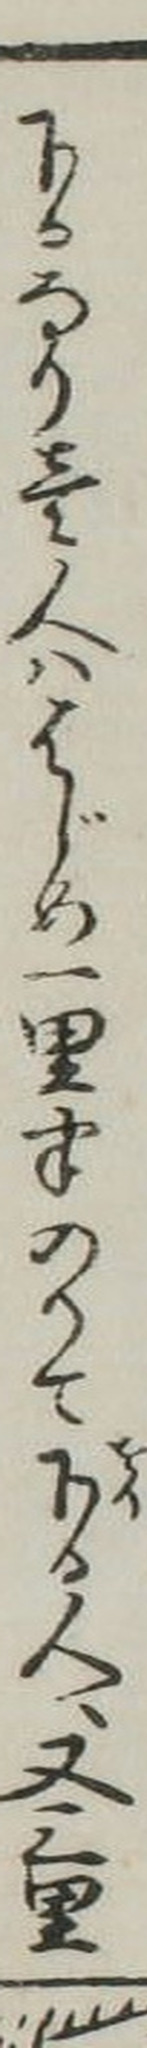下るなり壱人ははじめ一里半のりて下る人は又三里
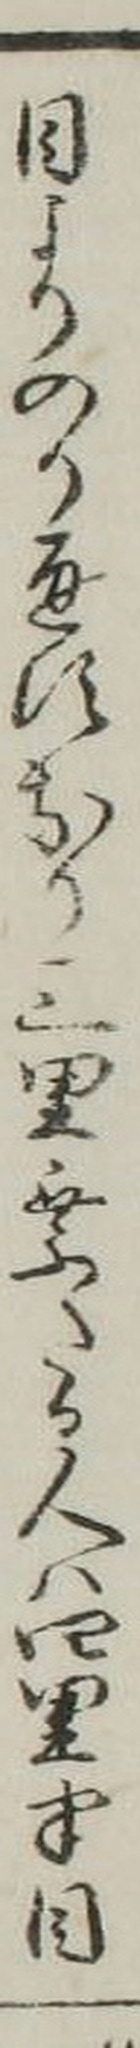目よりのり通すなり三里乗たる人は四里半目
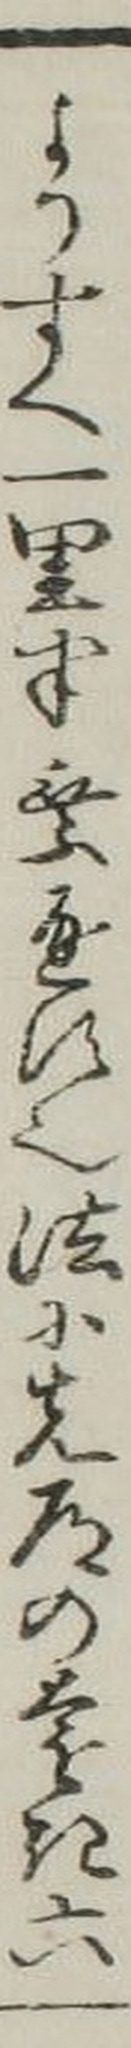よりすへ一里半乗通す也法に先道の遠き六
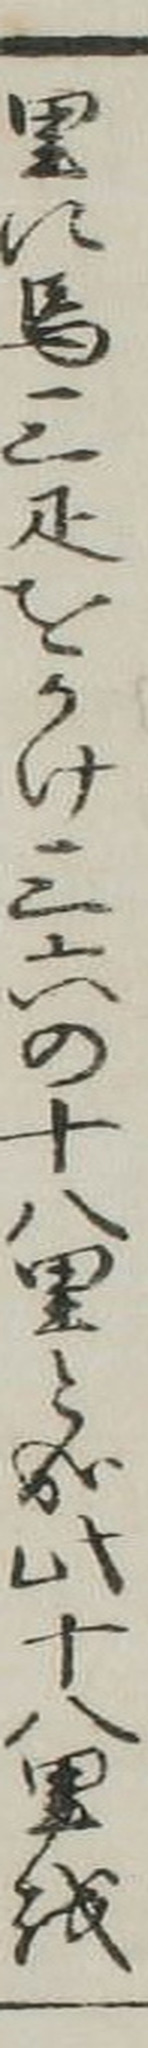里に馬三疋をかけ三六の十八里と成此十八里を
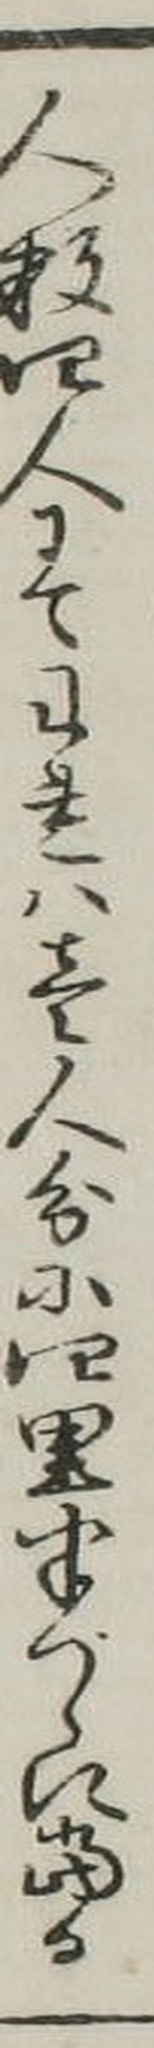人数四人にてわれは壱人分に四里半づゝに当る
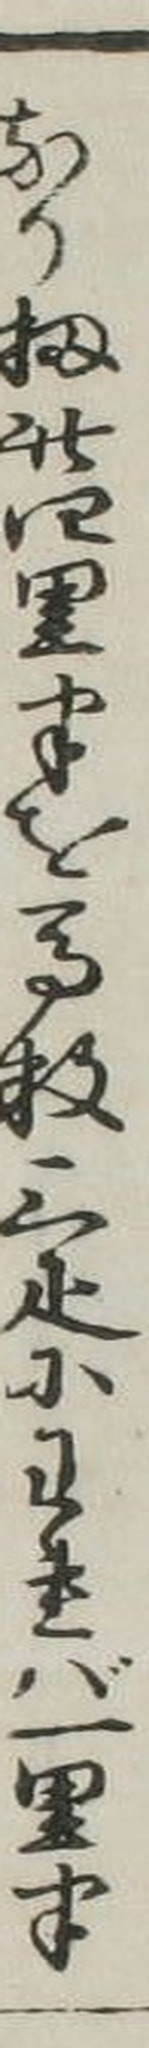なり扨此四里半を馬数三疋にわれば一里半
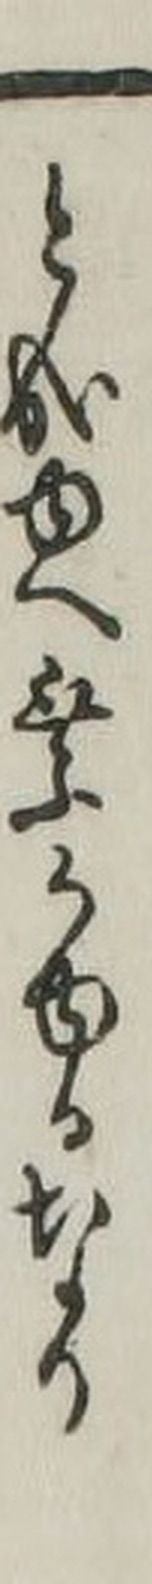と成ゆへ乗かゆるなり
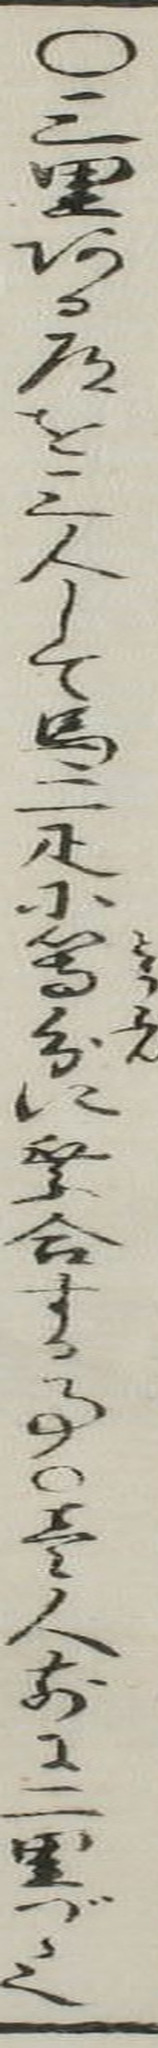○三里ある道を三人して馬二疋に等分に乗合する事○壱人前に二里づゝ也
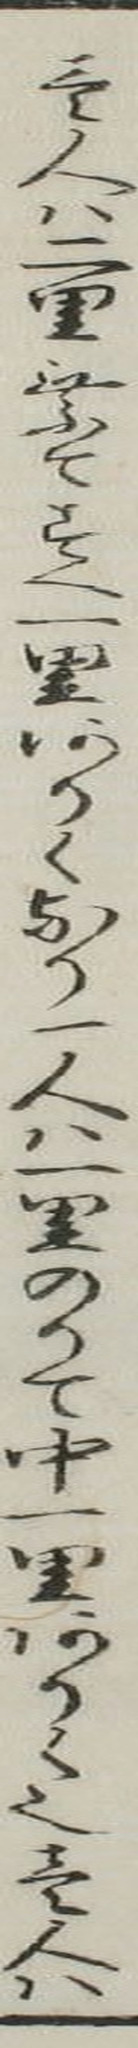壱人は二里乗てすへ一里ありくなり一人は一里のりて中一里ありく也壱人は
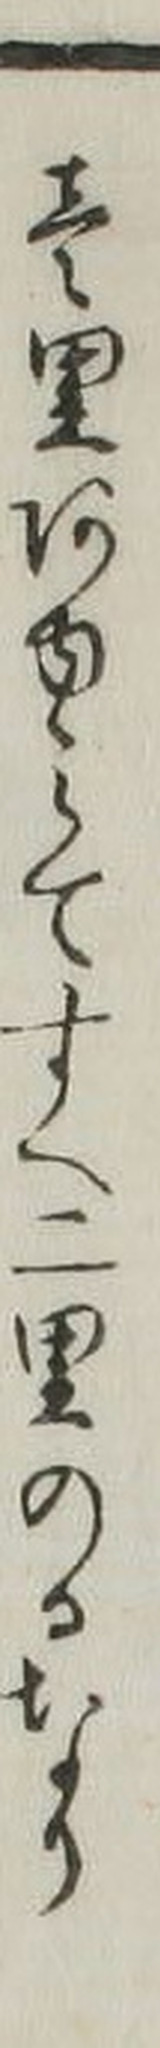壱里あゆみてすへ二里のるなり
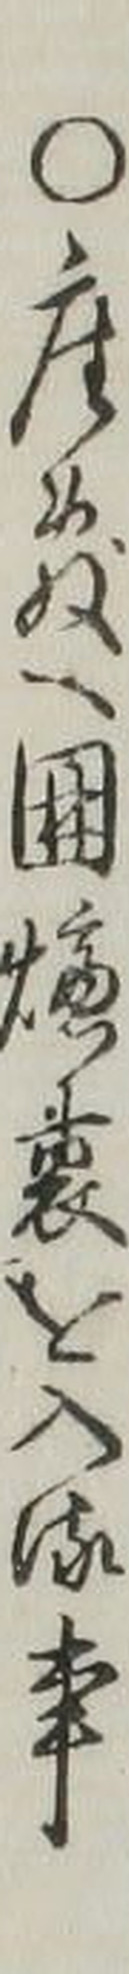○座敷へ囲炉裏を入る事
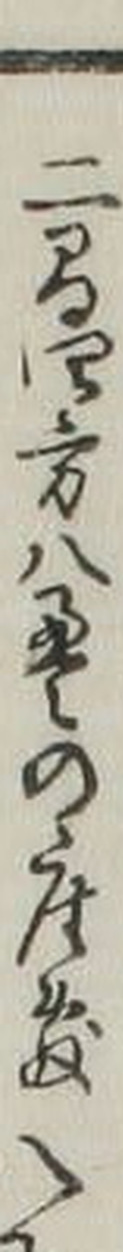二間四方八畳の座敷
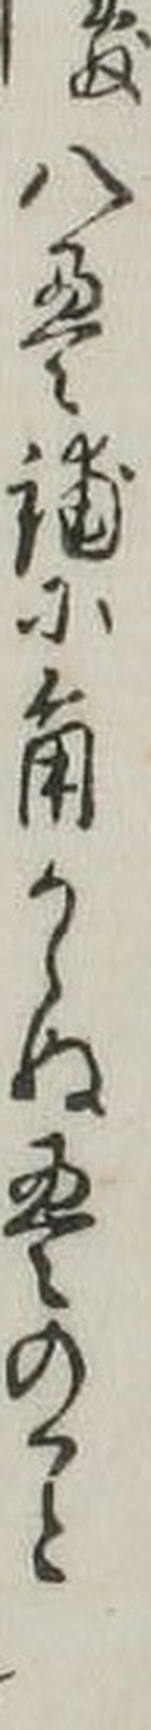八畳鋪に角かゝぬ畳のこと
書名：宝玉塵劫記
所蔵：東京学芸大学教育コンテンツアーカイブ
